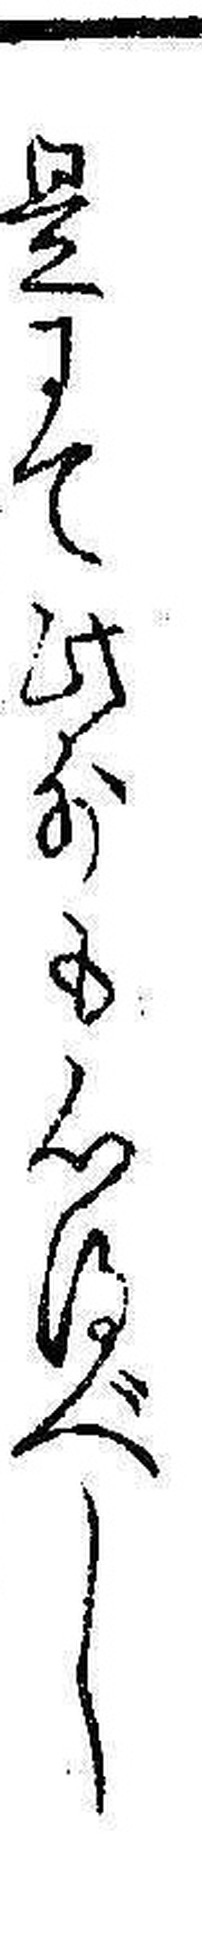是にて此外も心得べし
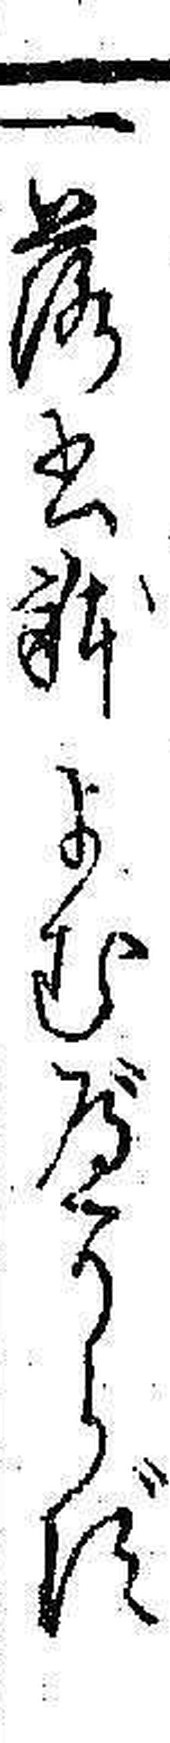一落書躰よむべからず

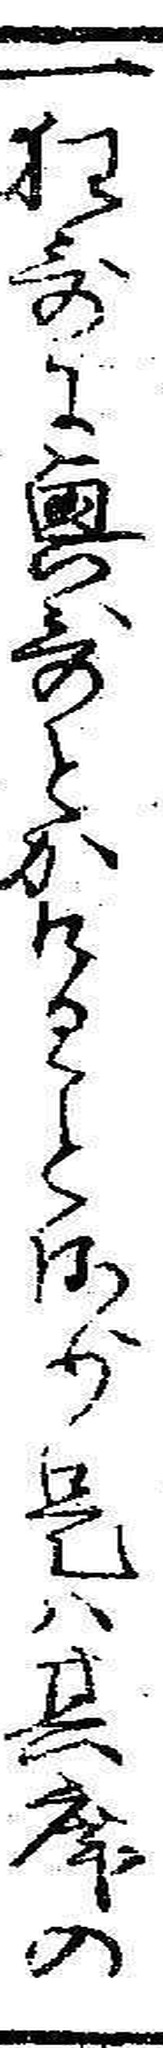一狂哥に興哥とかけることあり是は其席の
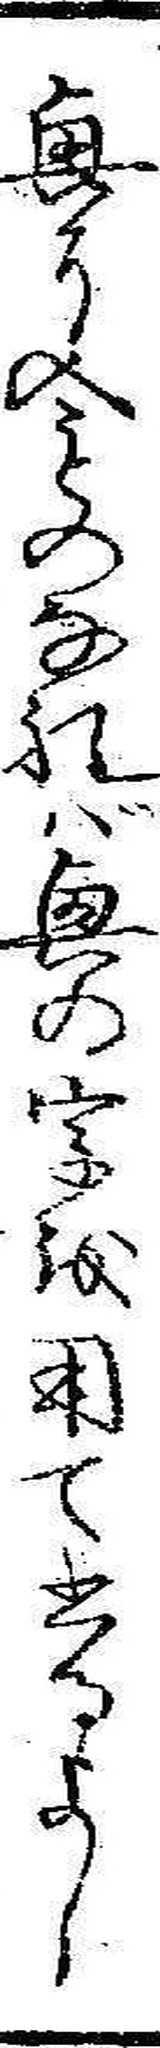興に入ことのなれば興の字を用て書るよし
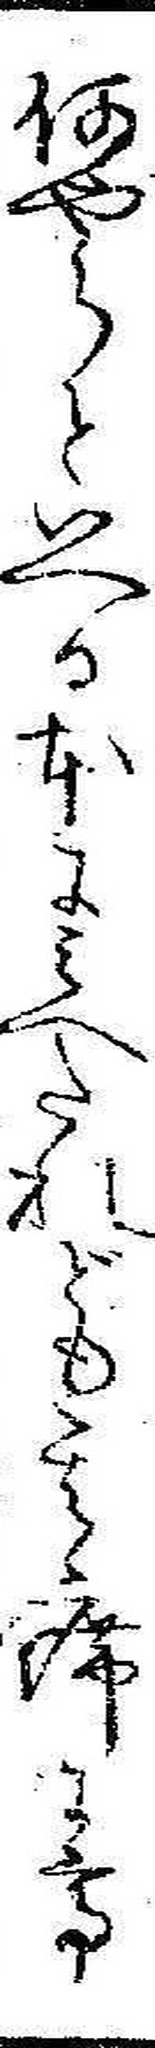何やらといへる本にみへたれども其席に高
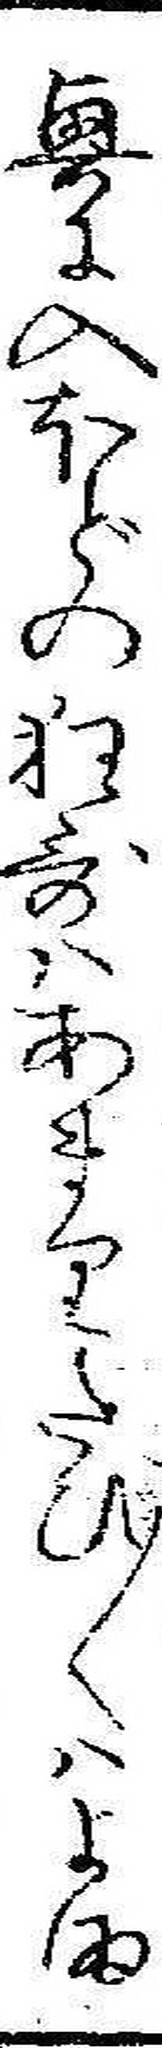興に入ほどの狂哥はあまりたび〳〵とよま
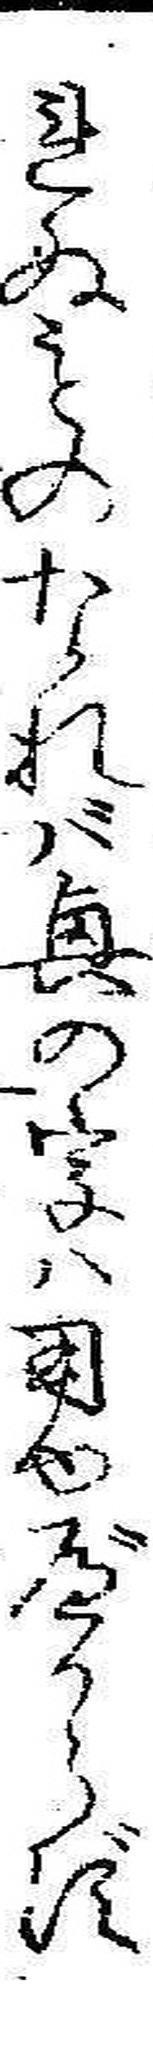れぬことのなれば興の字は用ゆべからず
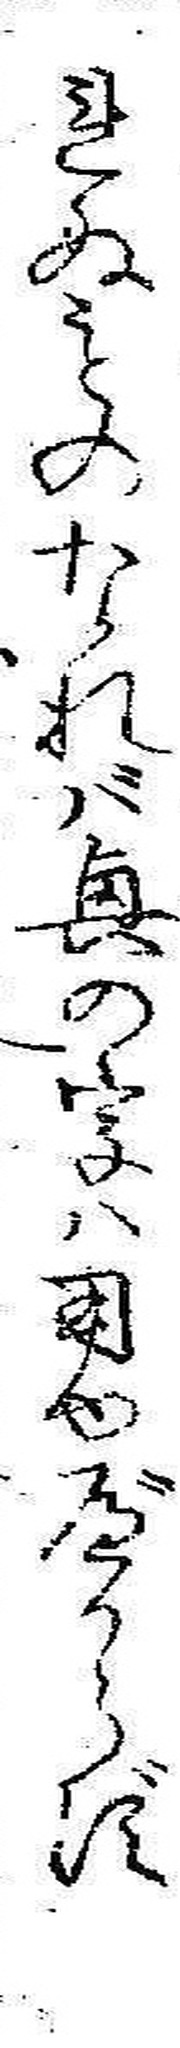れぬことのなれば興の字は用ゆべからず
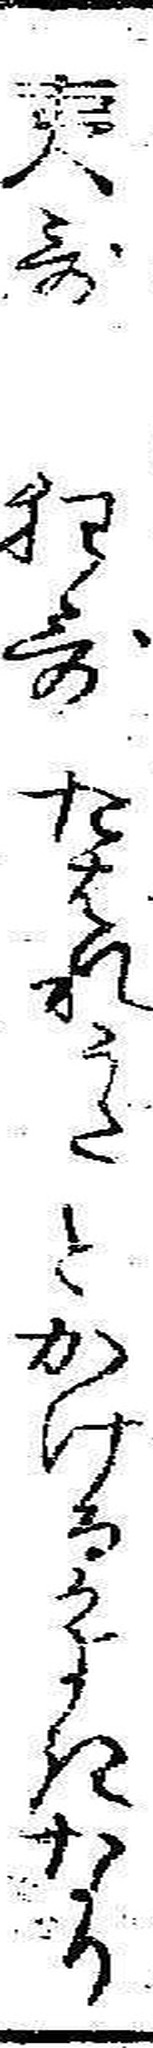夷哥狂哥たはれうたとかけるかよきなり
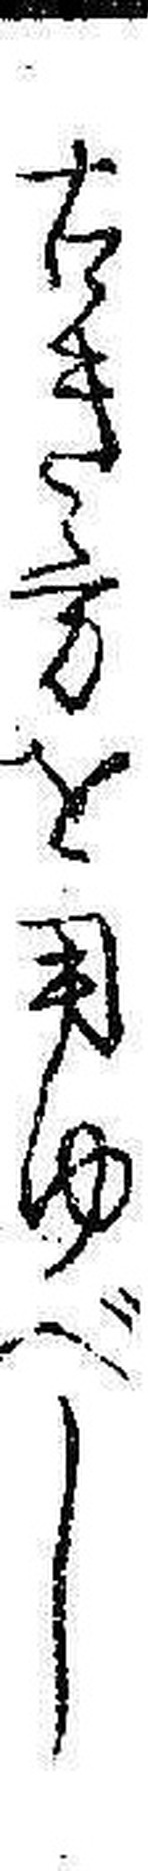古き方を用ゆべし
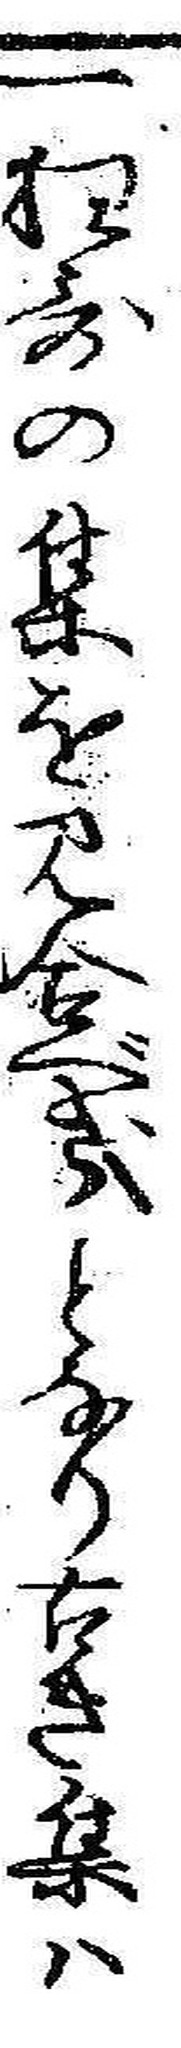一狂哥の集を見合いべとなり古き集は
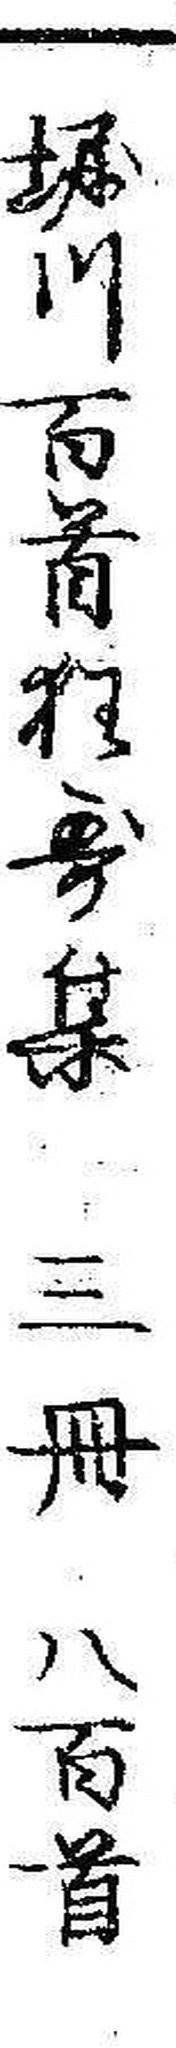堀川八百首狂哥集三冊八百首
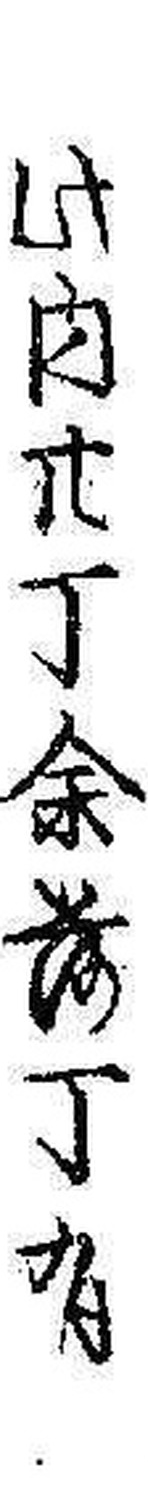此の内廾丁余落丁有
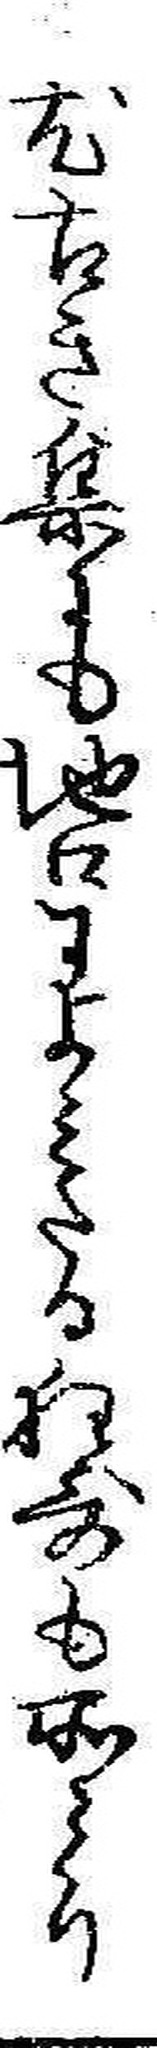尤古き集にも地口によみたる狂哥も所々
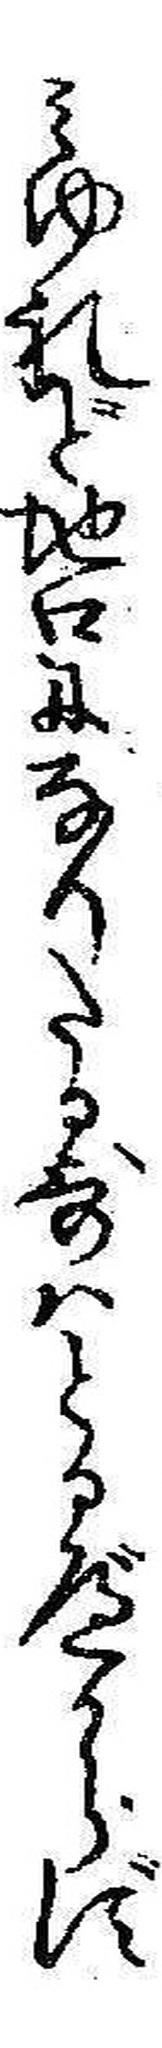みゆれど地口なりたる哥はとるべからず

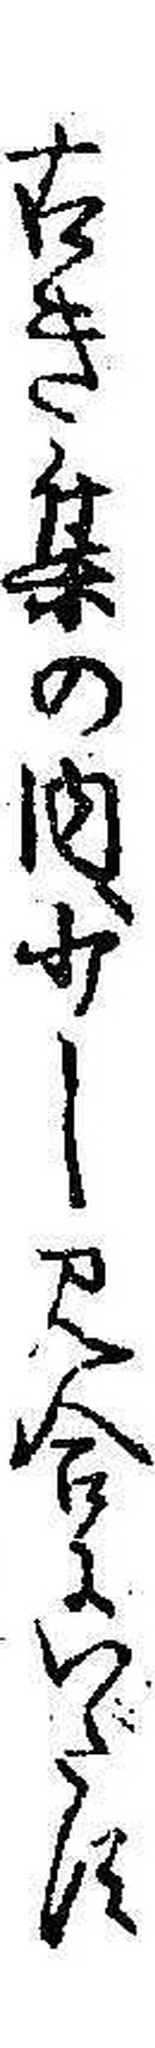古き集の内少し見合にいだす
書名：狂哥はまのきさご
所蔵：国文学研究資料館
